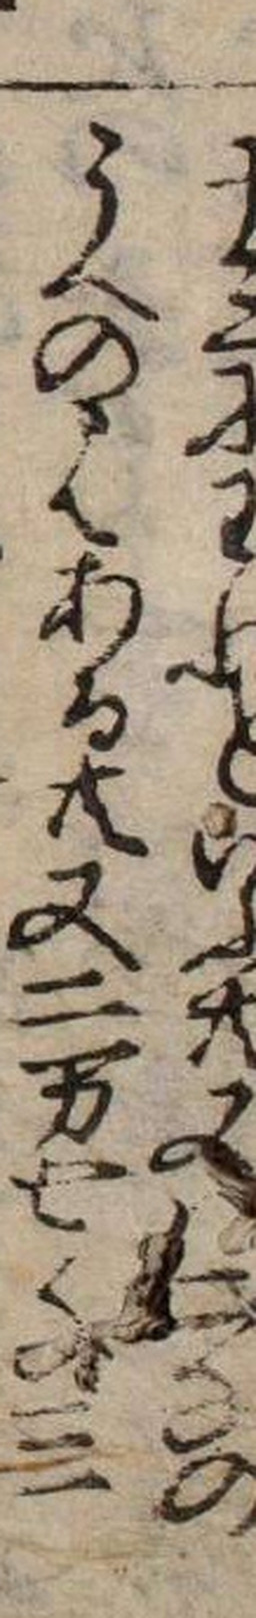うへのはんある共又二万七千三
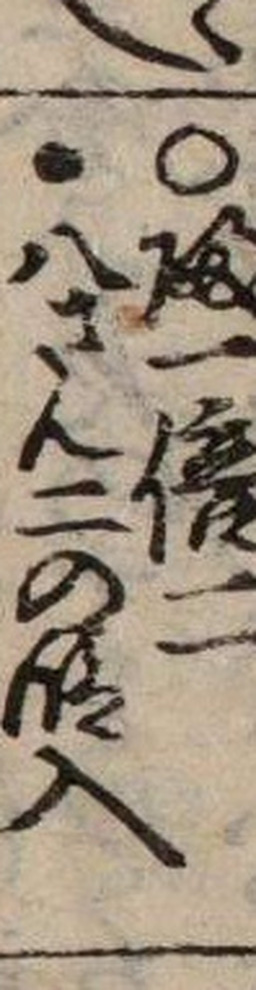●八さん二の段入
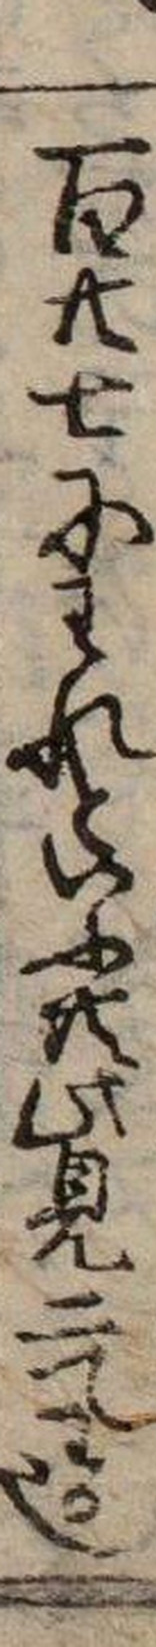百廾七にわれという共此見二てわる也
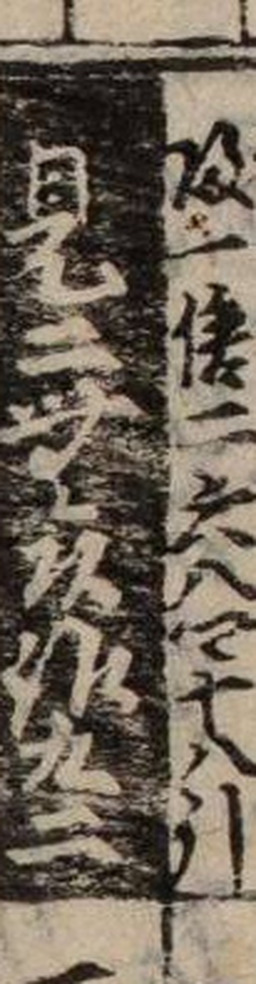△見二無頭作九二
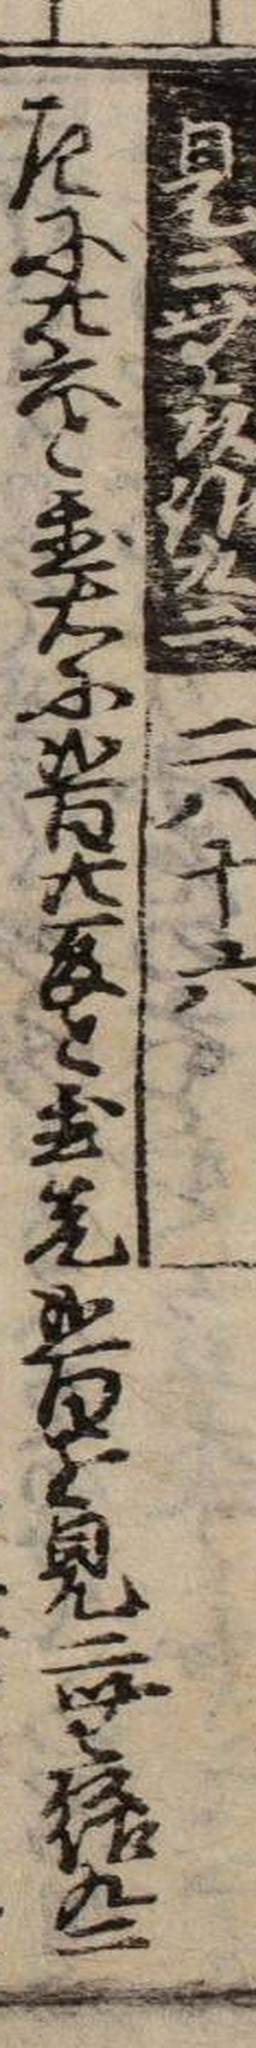左に廿六と置右に弐百廿一匁と置先弐百を見二無頭作九二
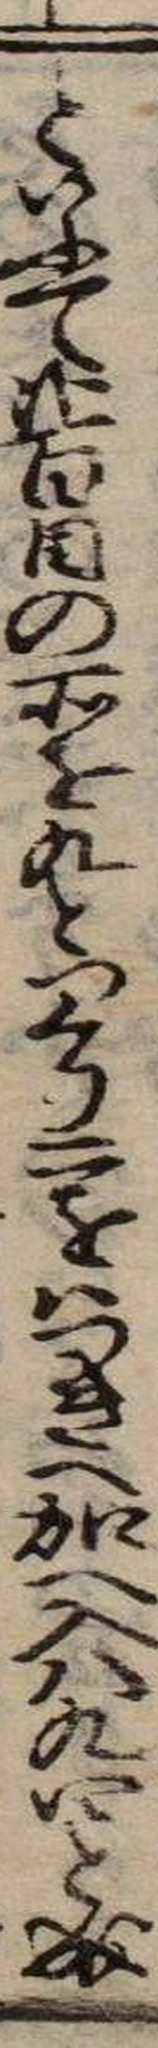といふて弐百目の所を九とつくり二をはつきへ加へ入八九四と成
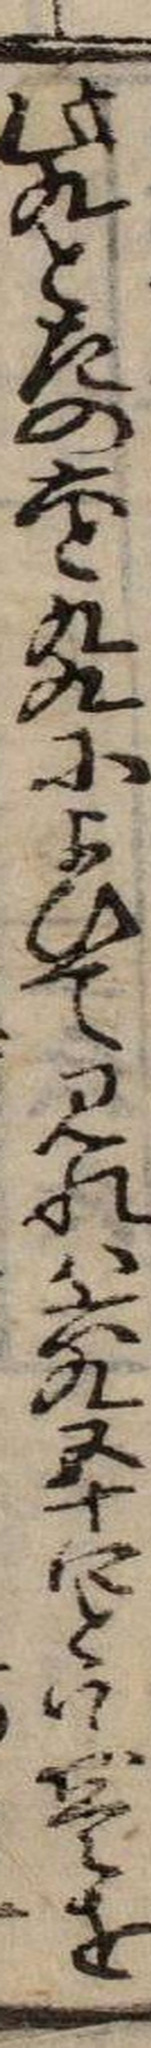此九と左の六と九九によひて見れは六九五十四とい[ふ]是を
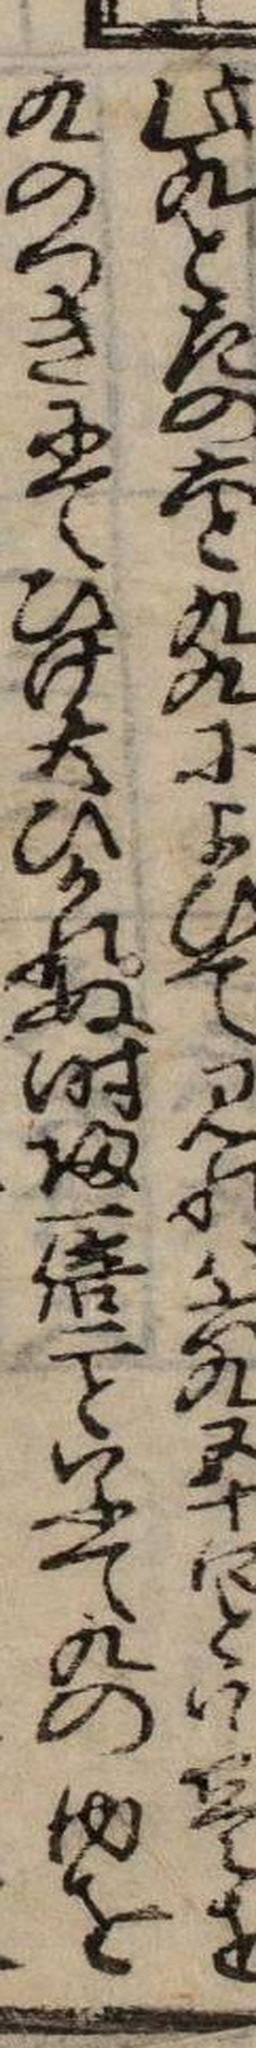九のつきにてひけ六ひかれぬ時帰一倍二といふて九の内を
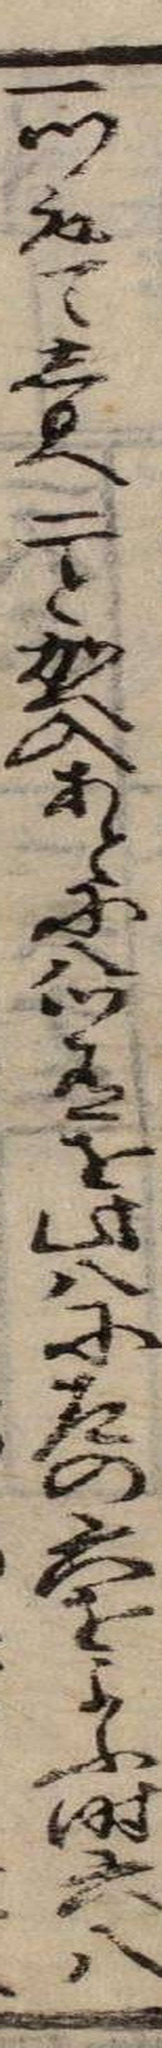一つ取てしもへ二と加へ入あとに八つ有を此八に左の六をよふ時六八
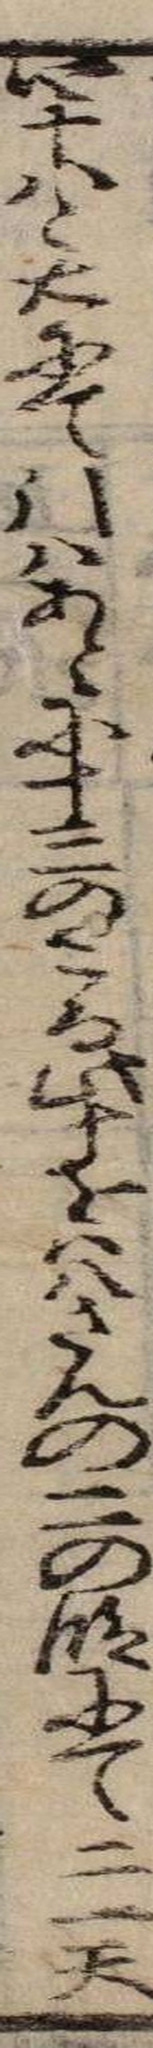四十八と六にて引はあとに十三のこる此十をは八さんの二の段にて二一天
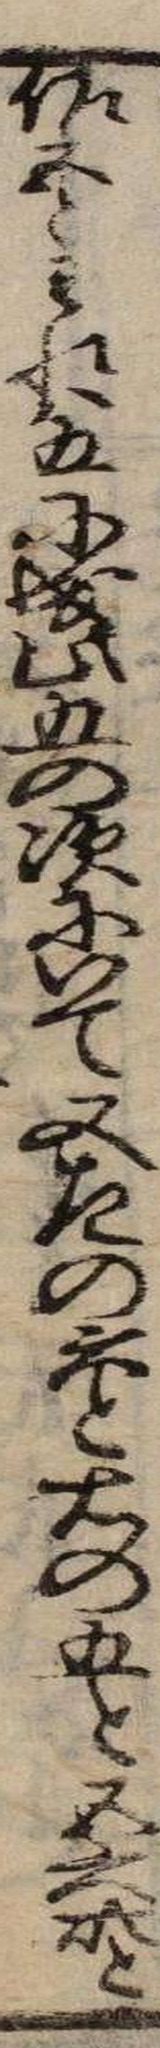作五とわれは五に成此五の次にいて又左の六と右の五と五六丗と
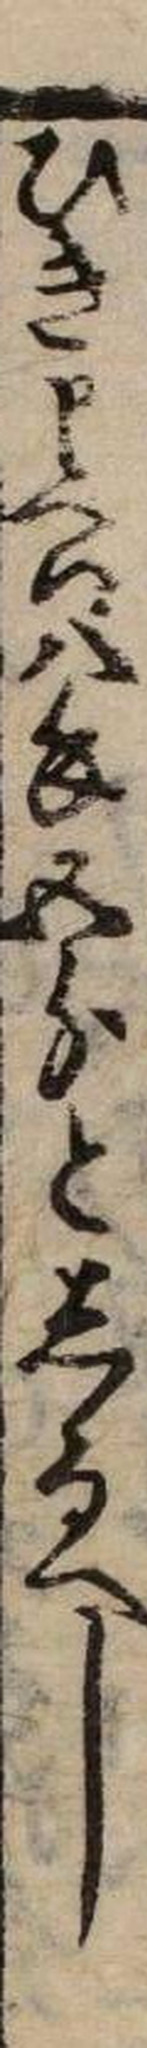ひき申候へは八匁五分としるへし
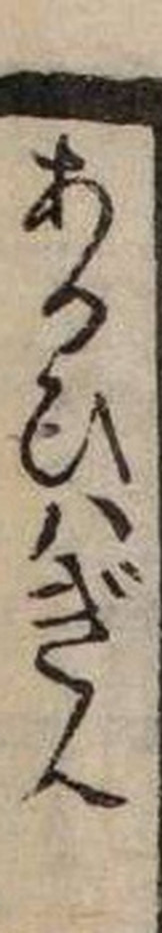あるひはぎん
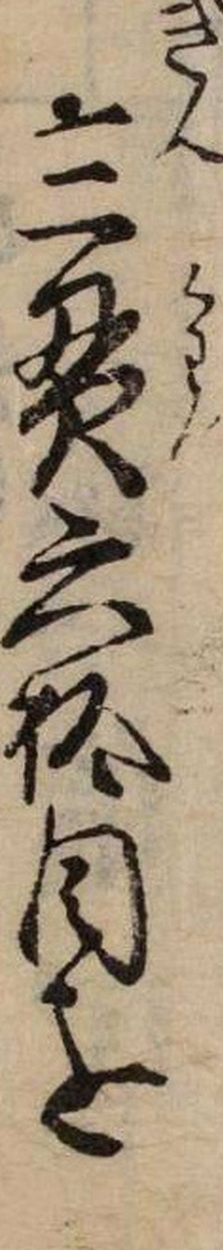三貫六拾目を
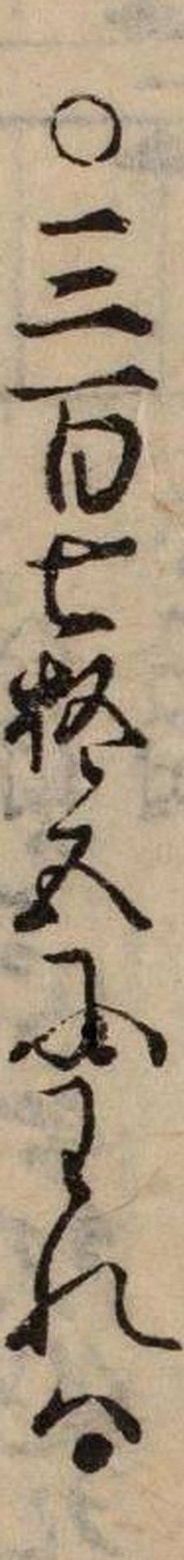○三百七拾五にわれは・
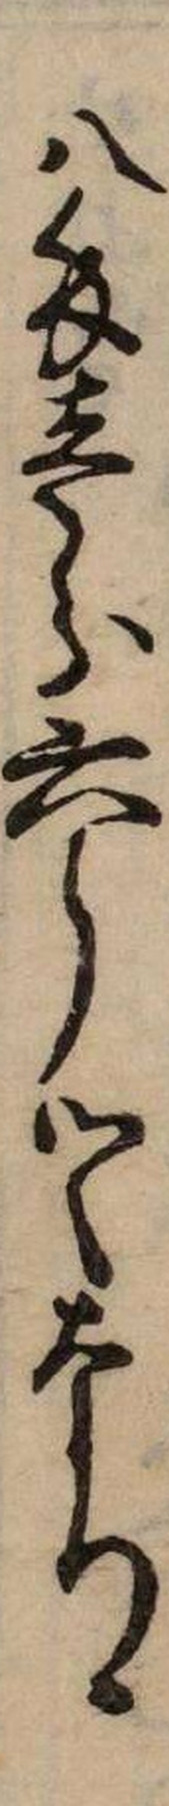八匁壱分六厘つゝなり
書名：塵劫記（寛永11年自跋、京都府立京都学・歴彩館追貴8）
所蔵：京都府立京都学・歴彩館 国文学研究資料館
